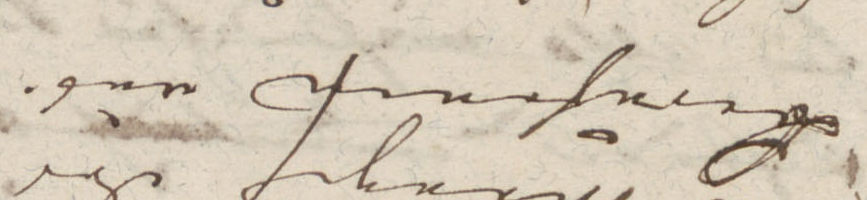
der Bearbeitung
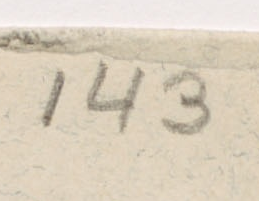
143
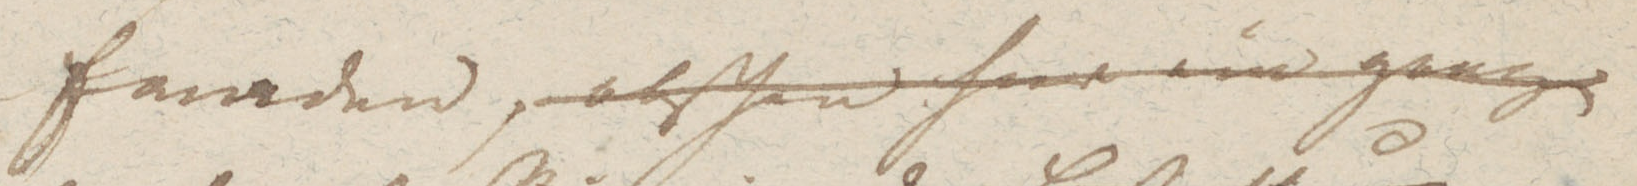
facaden, obschon hier ein ganz
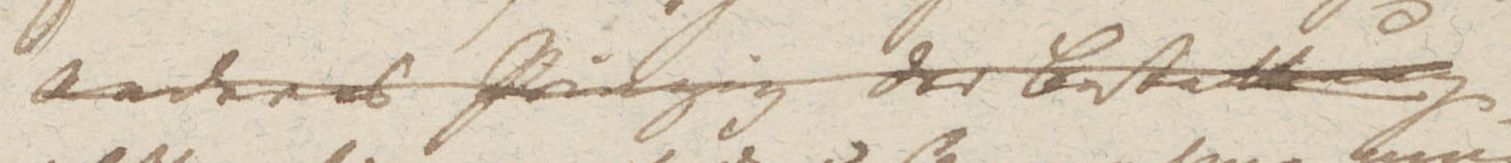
anderes Prinzip der Bestattung
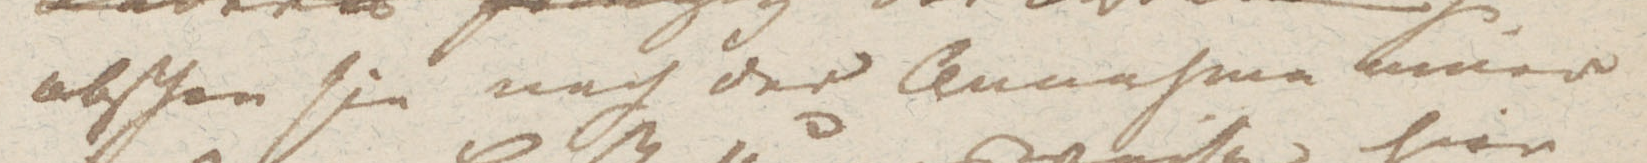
obschon sie nach der Annahme einer
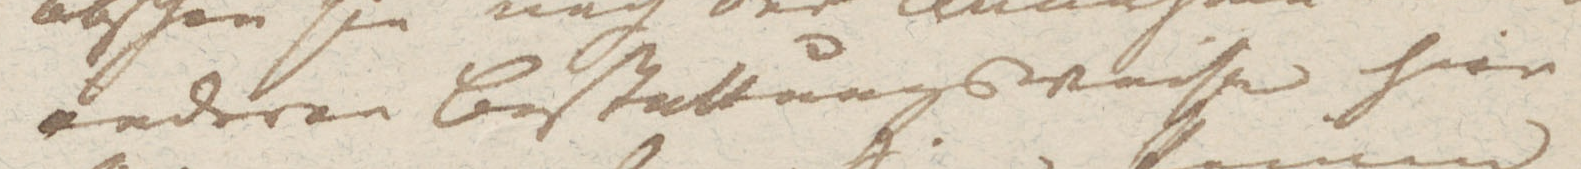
anderen Bestattungsweise hier
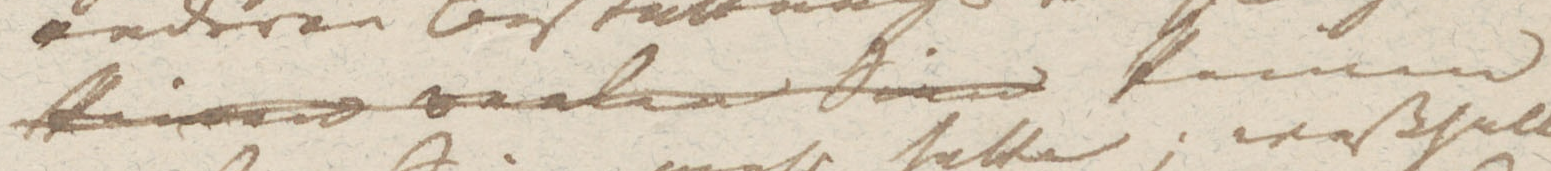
keinen realen Sinn keinen
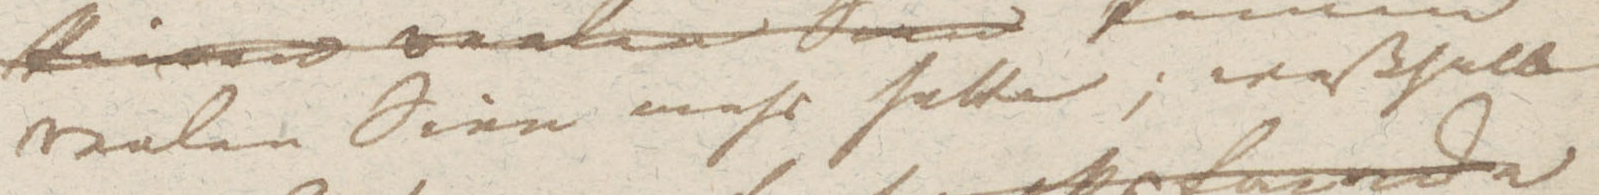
realen Sinn mehr hatte; wesshalb
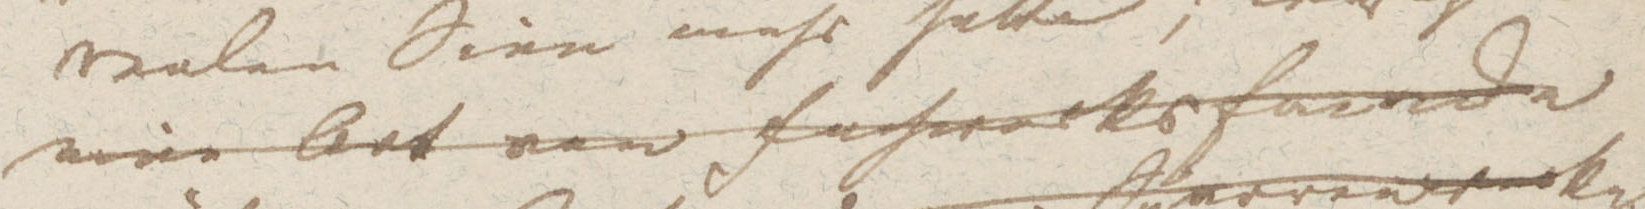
eine Art von Fachwerksfacade
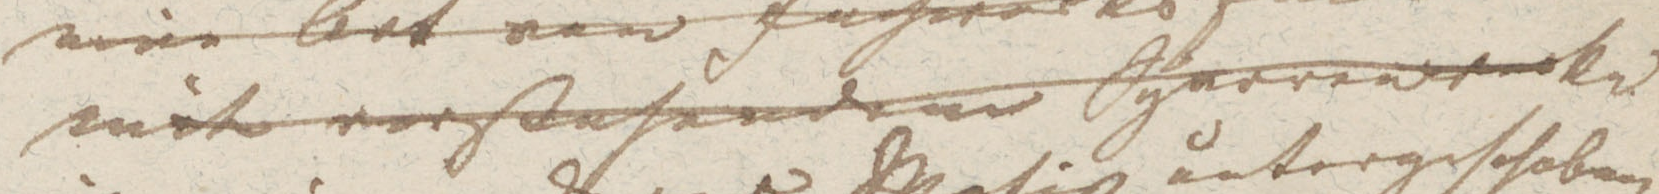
mit vorstehendem Sparrenwerke
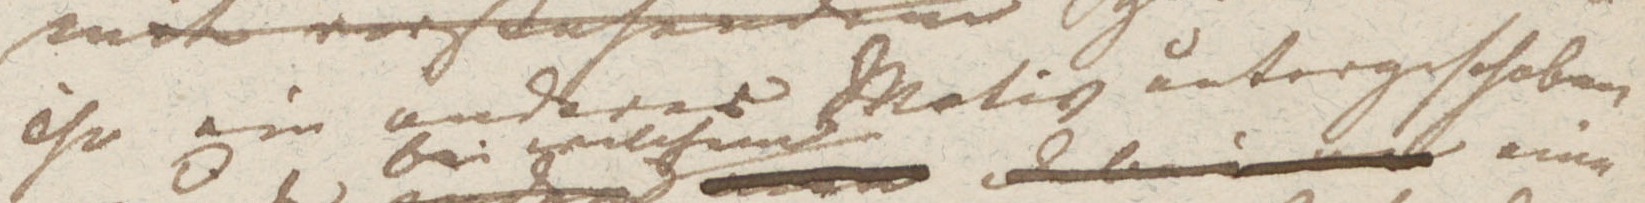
ihr ein anderes Motiv untergeschoben
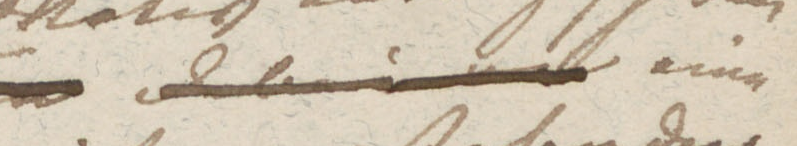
man dabei an eine
